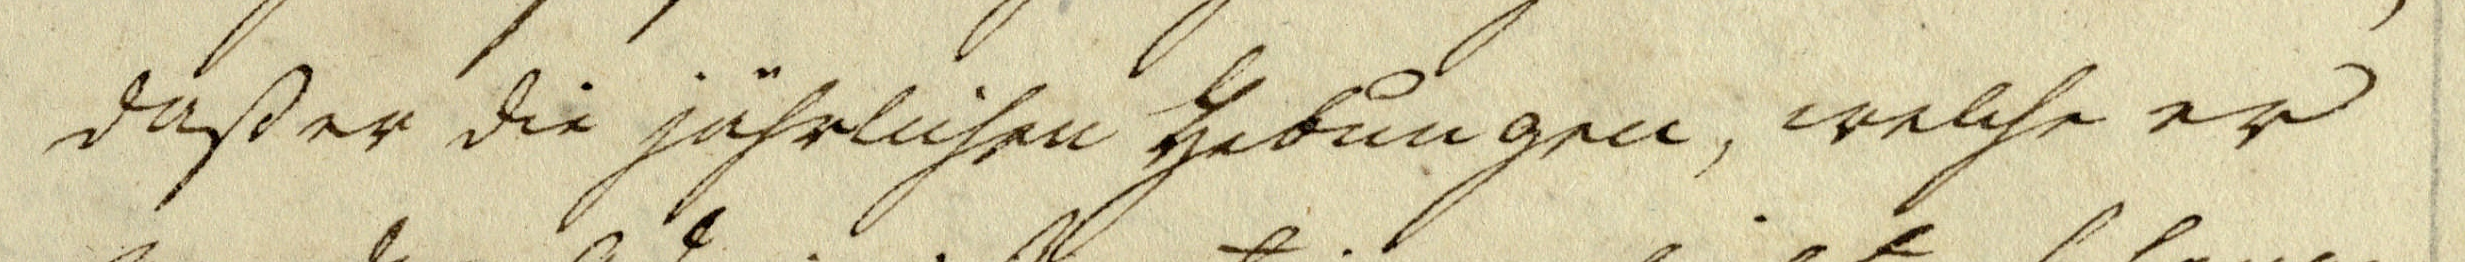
daß er die jährlichen Hebungen, welche er
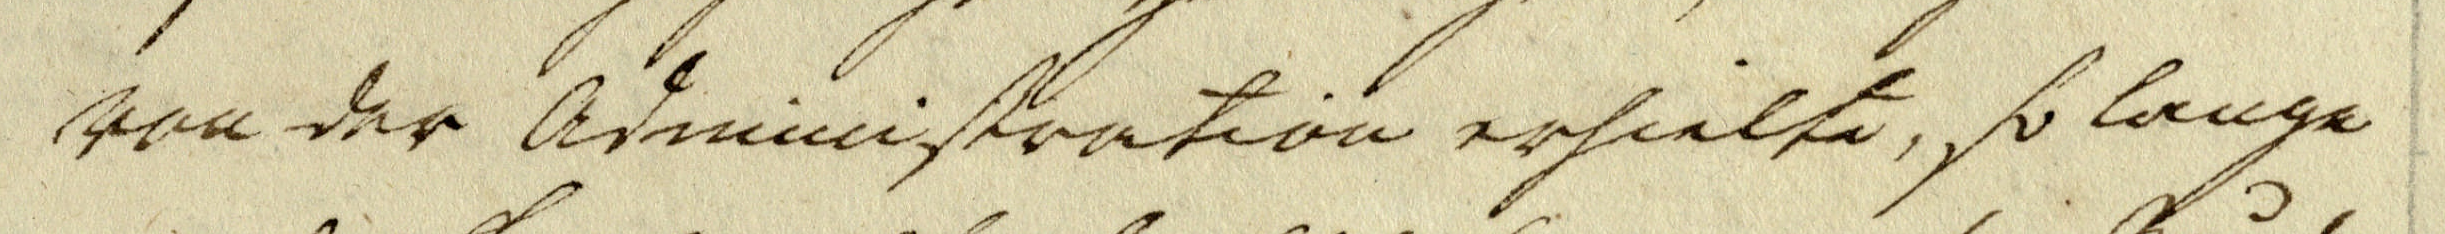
von der Administration erhielte, so lange
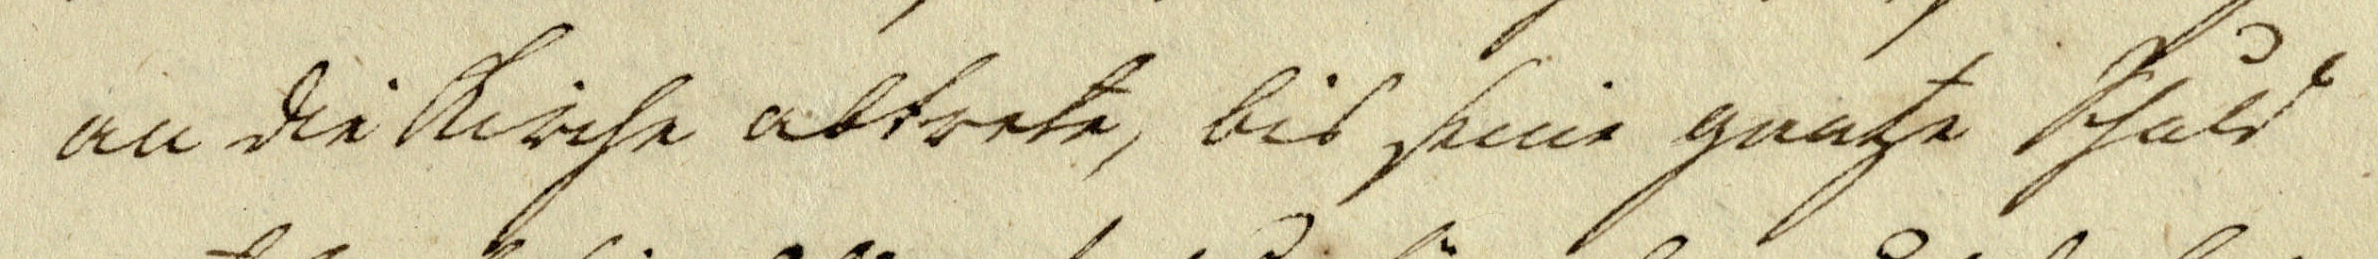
an die Kirche abtrete, bis seine gantze Schuld
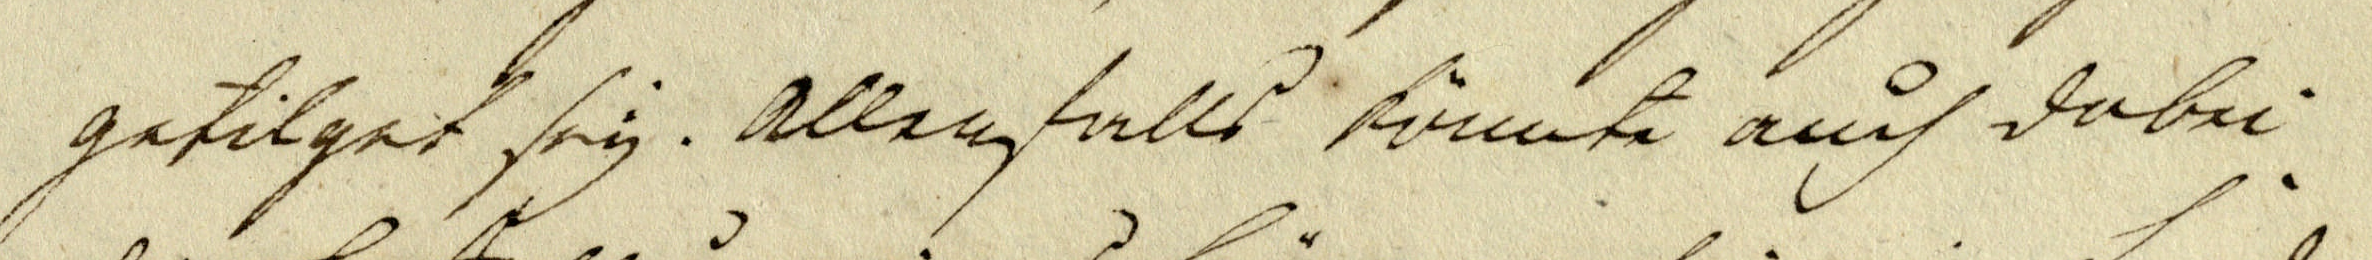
getilget seÿ. Allenfalls könnte auch dabei
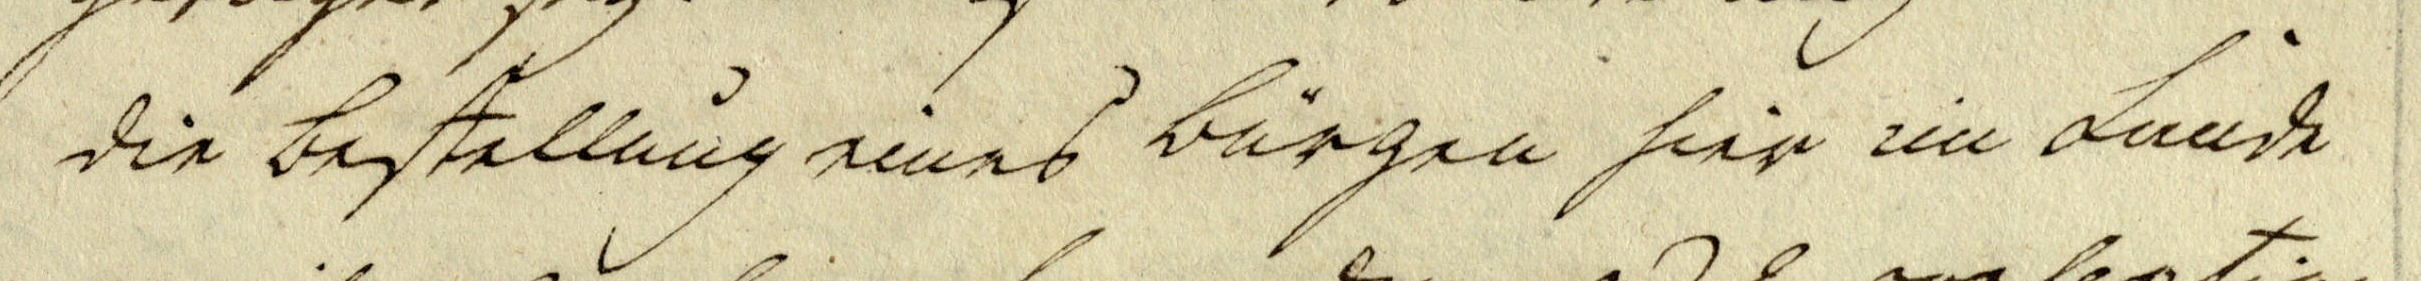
die Bestellung eines Bürgen hier im Lande
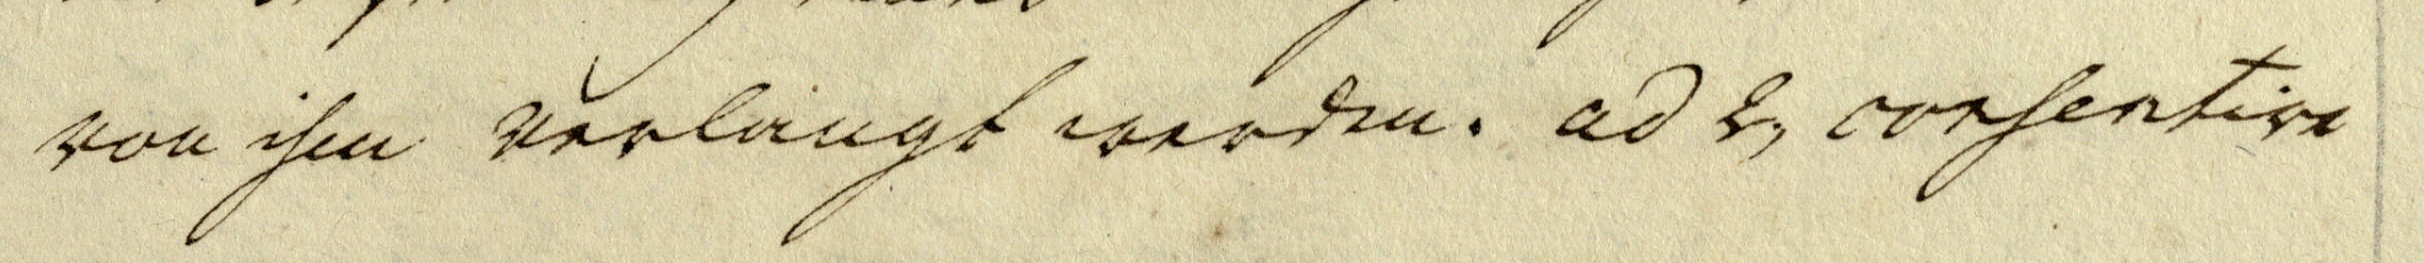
von ihm verlangt werden. ad 2., consentire
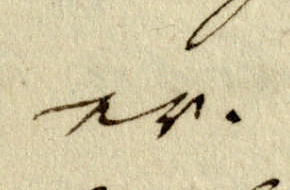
er.
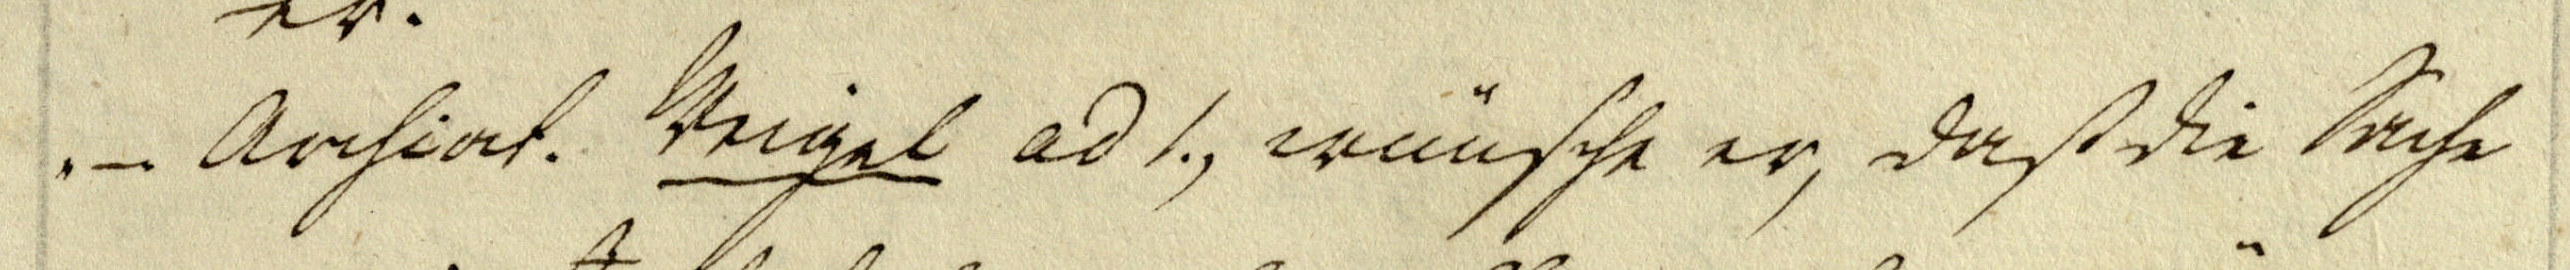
Archiat. Weigel ad 1., wünsche er, daß die Sache
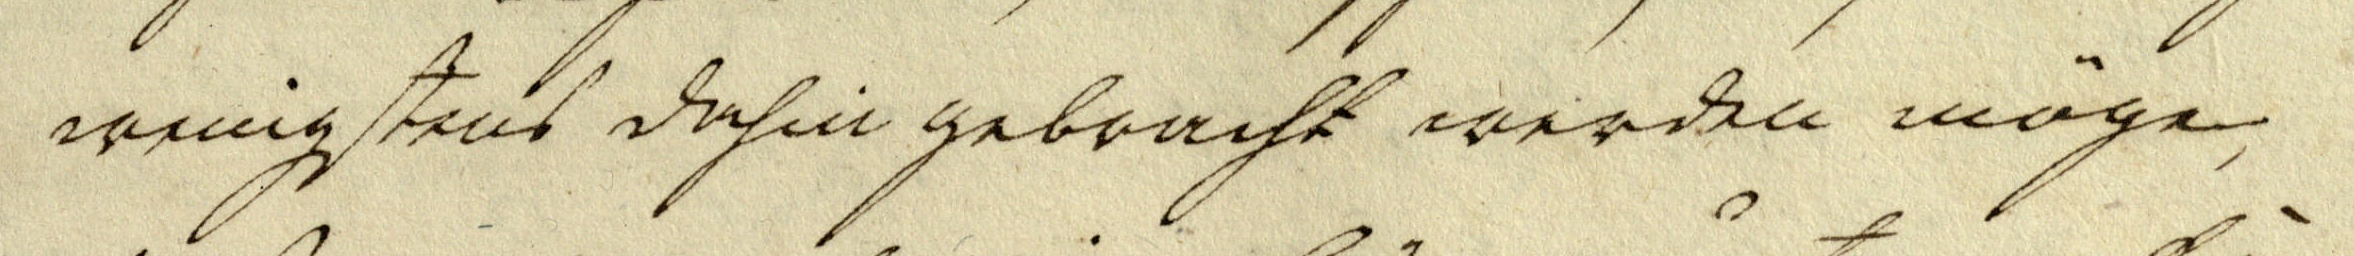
wenigstens dahin gebracht werden möge,
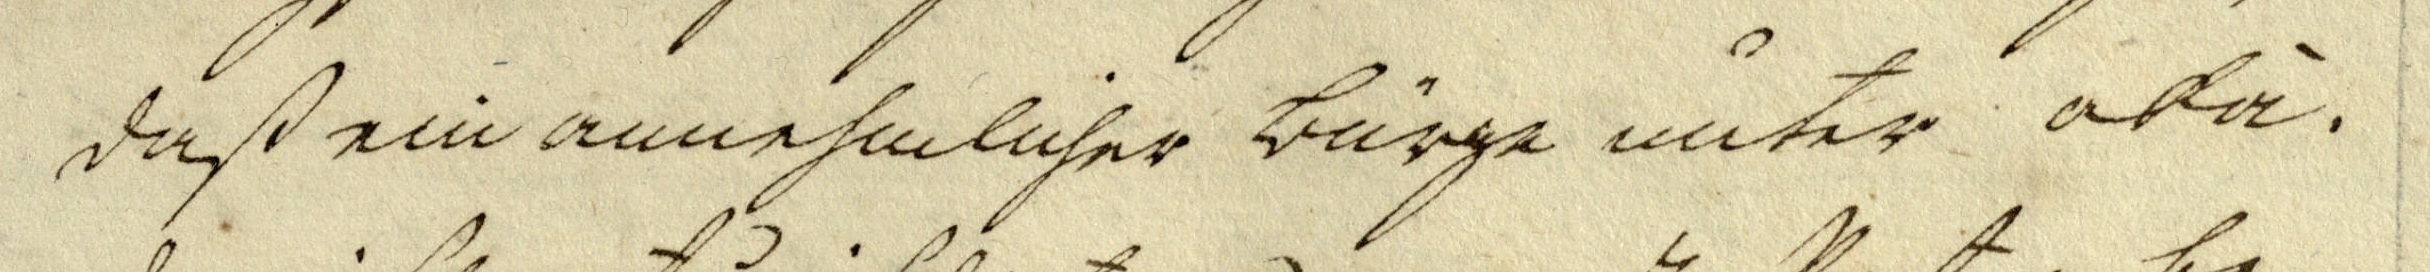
daß ein annehmlicher Bürge unter aka¬
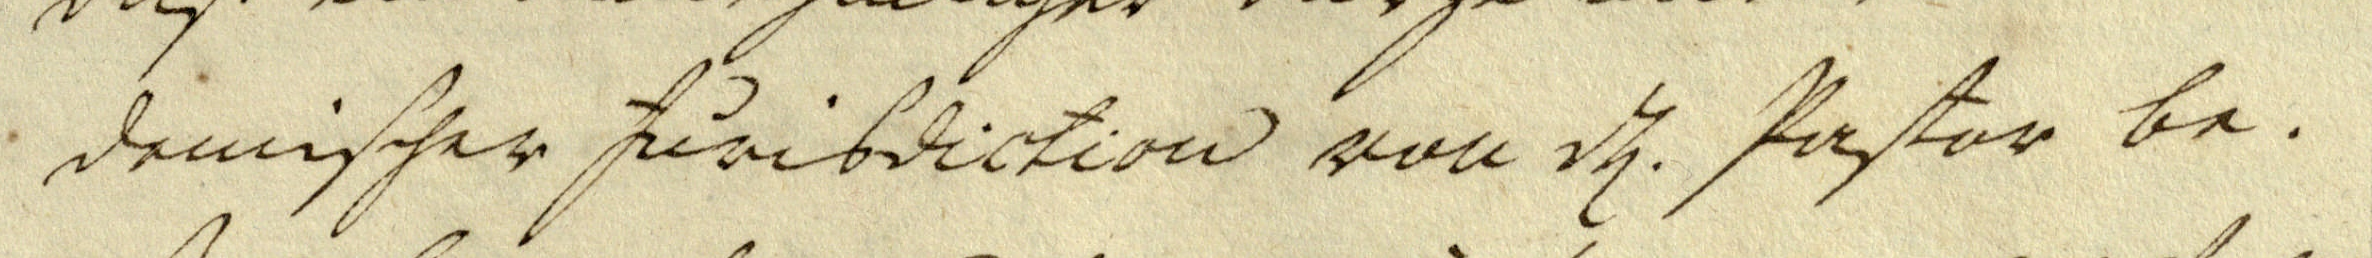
demischer Jurisdiction von dh. Pastor be¬
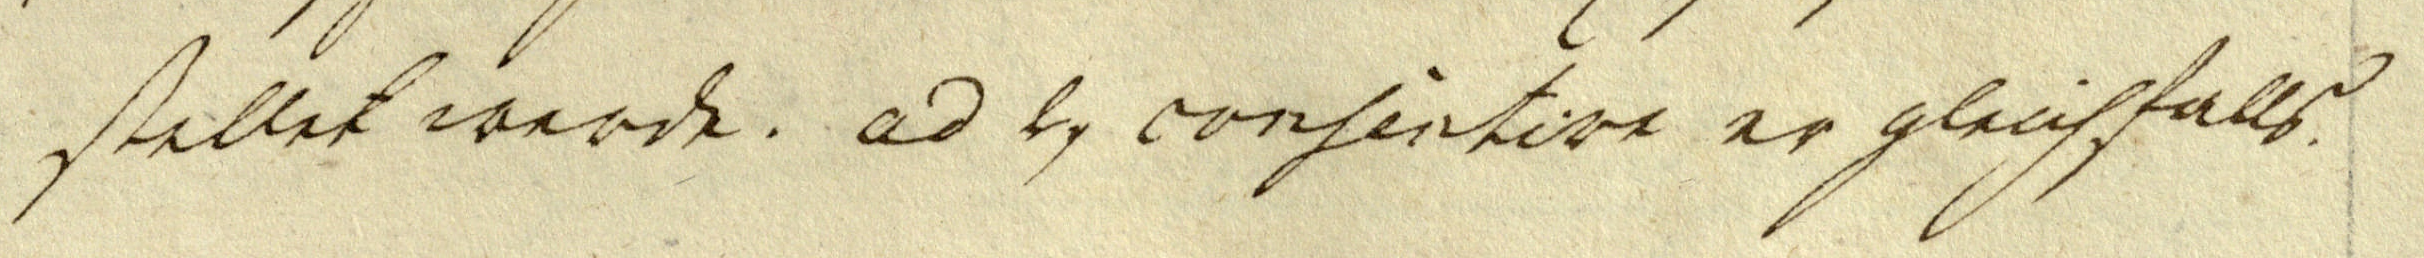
stellet werde. ad 2., consentire er gleichfalls.
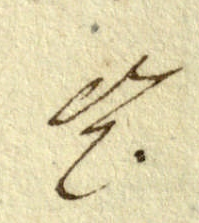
dh.
